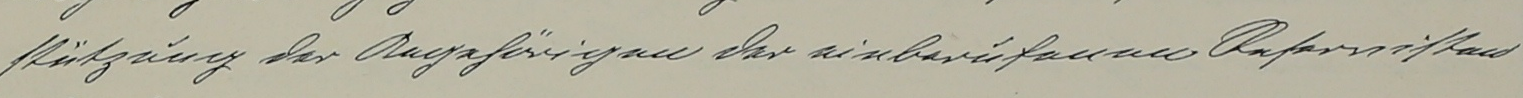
stützung der Angehörigen der einberufenen Reservisten
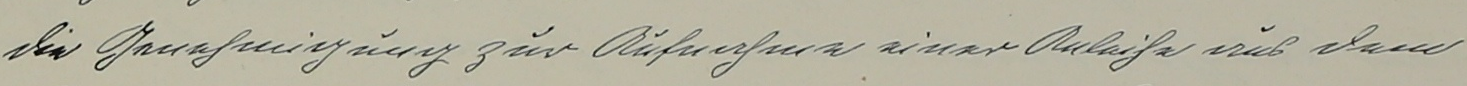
die Genehmigung zur Aufnahme einer Anleihe aus dem
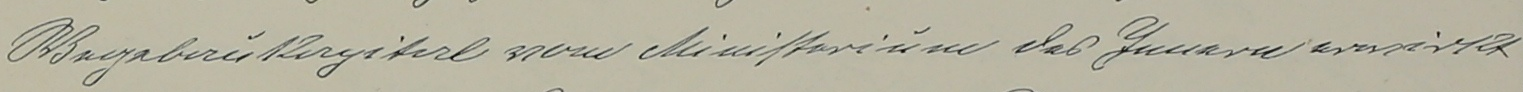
Wegebaukapital vom Ministerium des Innern erwirkt
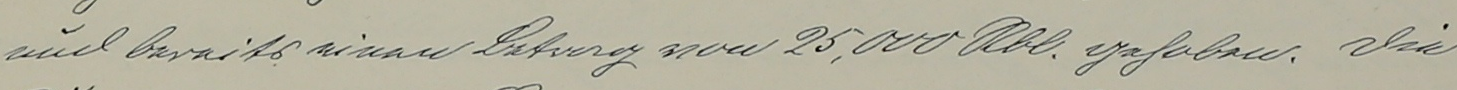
und bereits einen Betrag von 25.000 Rbl. gehoben. Die
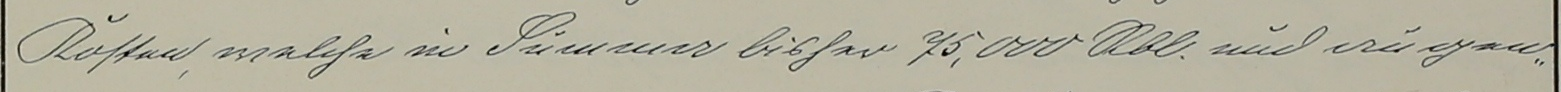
Kosten, welche in Summa bisher 75.000 Rbl. und augen-
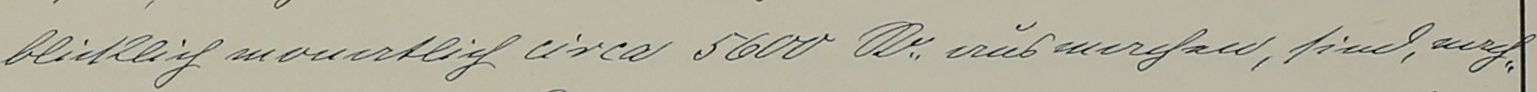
blicklich monatlich circa 5600 Ro. ausmachen, sind, nach-
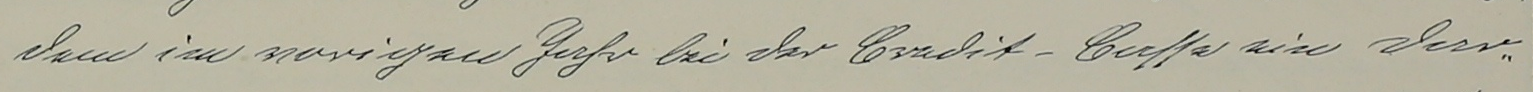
dem im vorigen Jahr bei der Credit-Casse ein Dar-
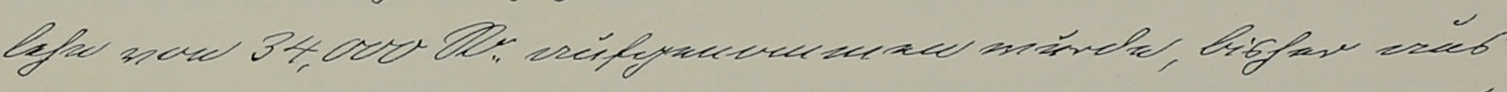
lehn von 34.000 Ro. aufgenommen wurde, bisher aus
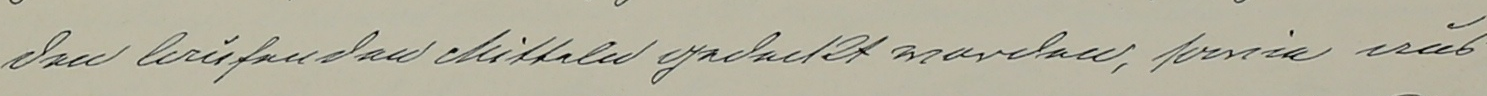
den laufenden Mitteln gedeckt worden, sowie aus
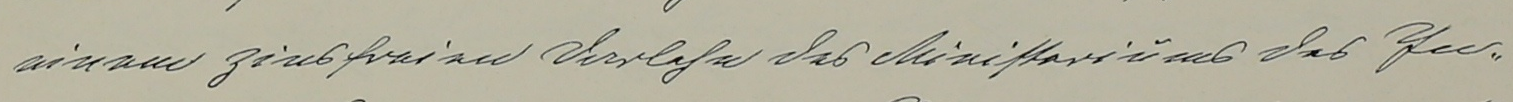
einem zinsfreien Darlehn des Ministeriums des In-
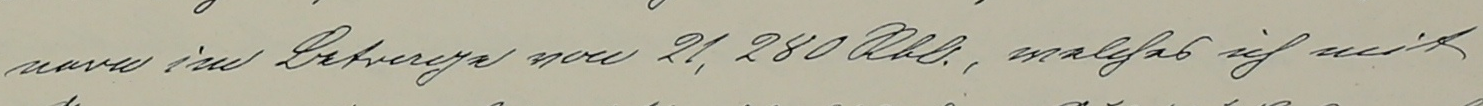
nern im Betrage von 21.280 Rbl., welches ich mit
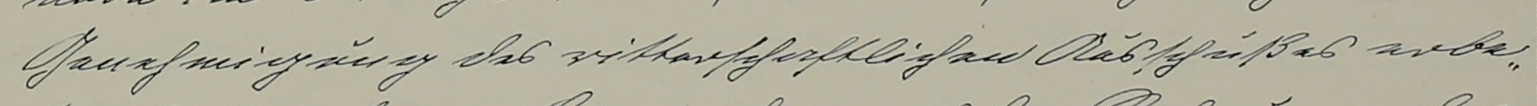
Genehmigung des ritterschaftlichen Ausschußes erbe-
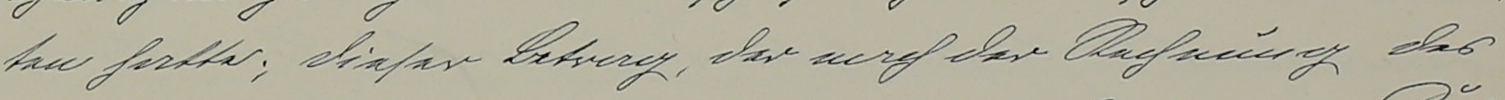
ten hatte; dieser Betrag, der nach der Rechnung des
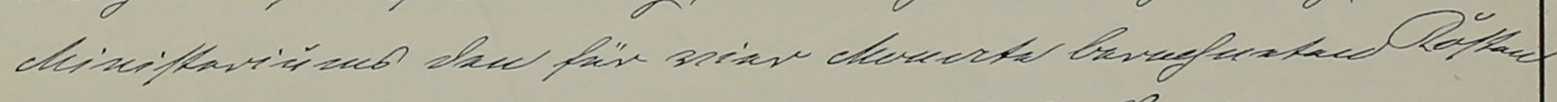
Ministeriums den für vier Monate berechneten Kosten
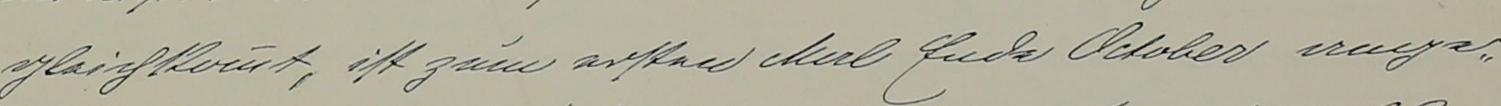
gleichkommt, ist zum ersten Mal Ende October ange-
